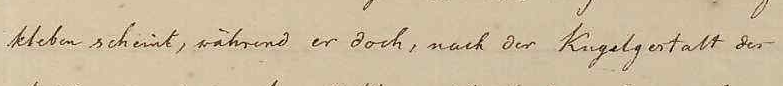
kleben scheint, während er doch, nach der Kugelgestalt des
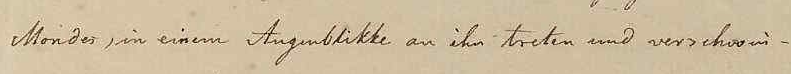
Mondes, in einem Augenblikke an ihn treten und verschwin-
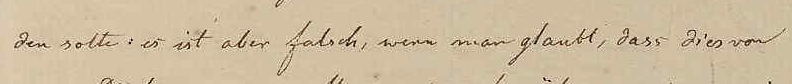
den solte: es ist aber falsch, wenn man glaubt, dass dies von
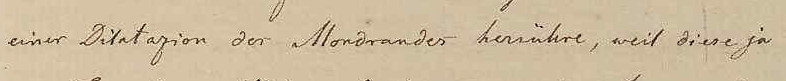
einer Dilatazion des Mondrandes herrühre, weil diese ja
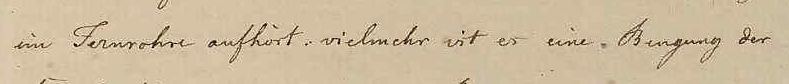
im Fernrohre aufhört: vielmehr ist es eine Beugung der
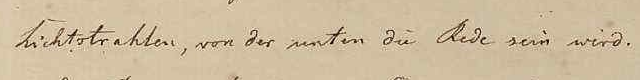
Lichtstrahlen, von der unten die Rede sein wird.
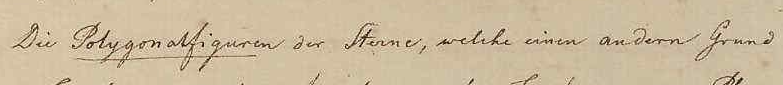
Die Polygonalfiguren der Sterne, welche einen andern Grund
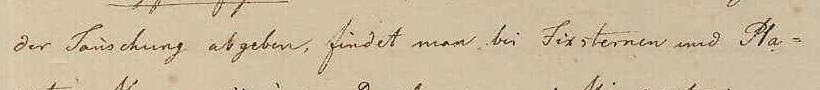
der Täuschung abgeben, findet man bei Fixsternen und Pla-
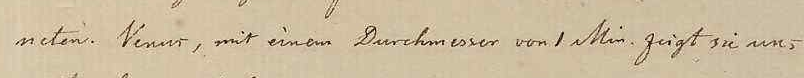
neten. Venus, mit einem Durchmesser von 1 Min. zeigt sie uns
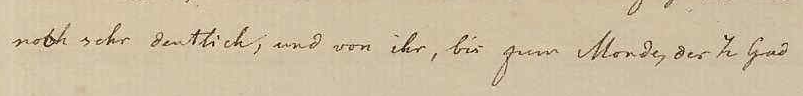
noch sehr deutlich, und von ihr, bis zum Monde, der ½ Grad
